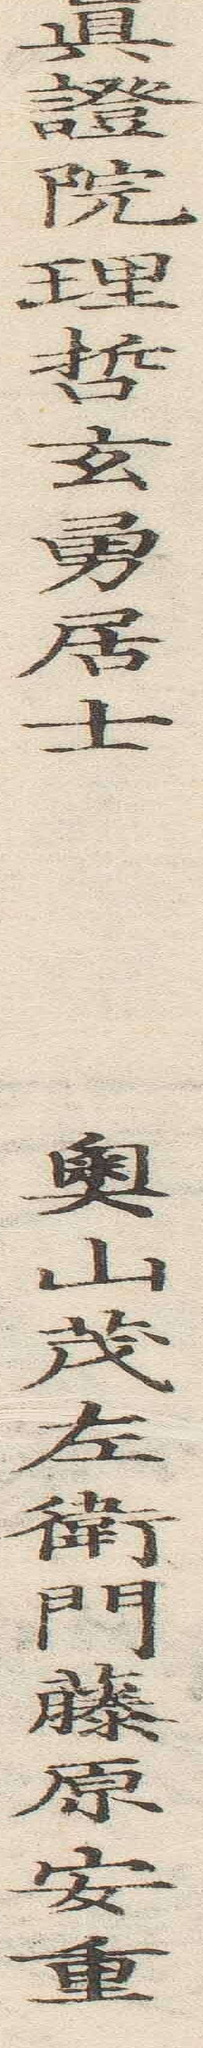眞證院理哲玄勇居士奥山茂左衛門藤原安重
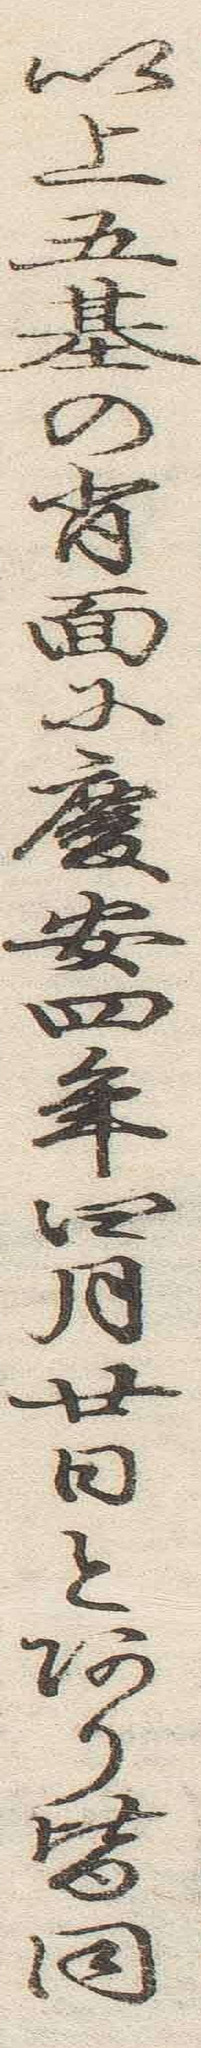以上五基の背面に慶安四年四月廿日とあり皆同
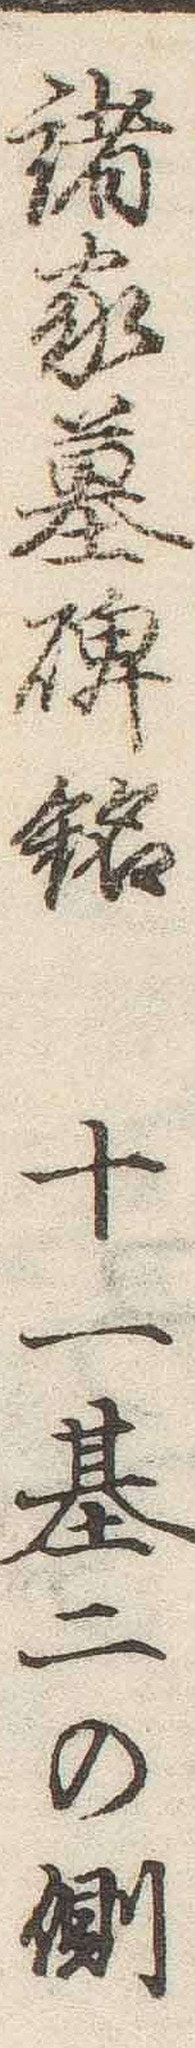諸家墓碑銘十一基二の側
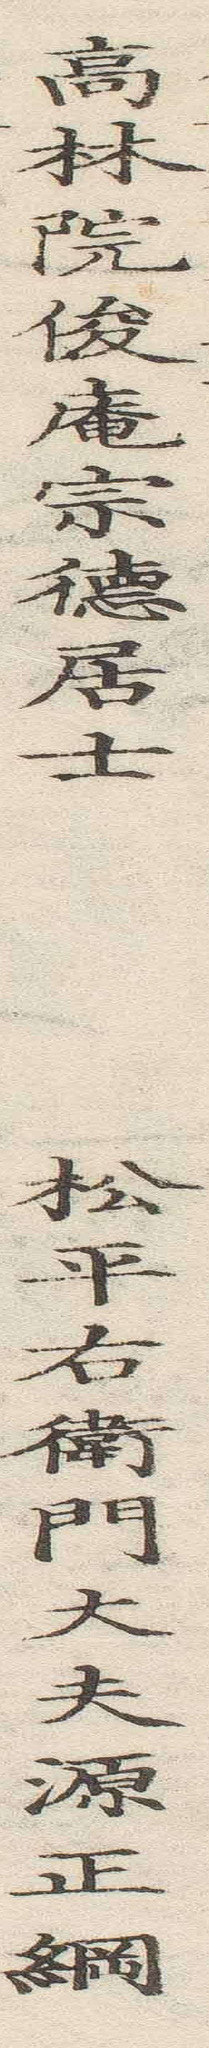高林院俊庵宗德居士松平右衛門大夫源正綱
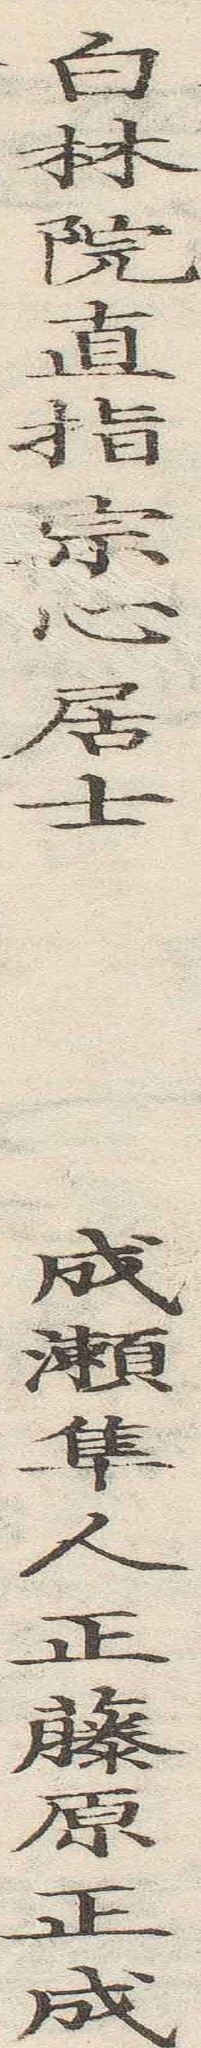白林院直指宗心居士成瀬隼人正藤原正成
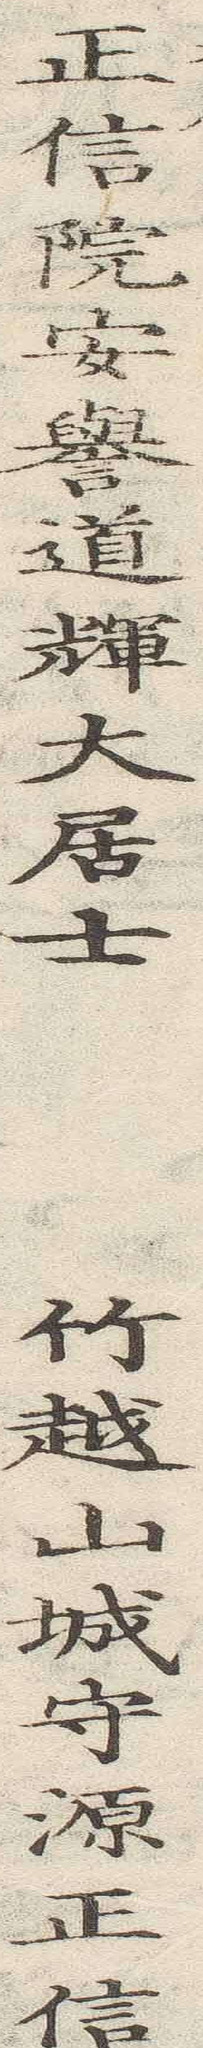正信院安譽道輝大居士竹越山城守源正信
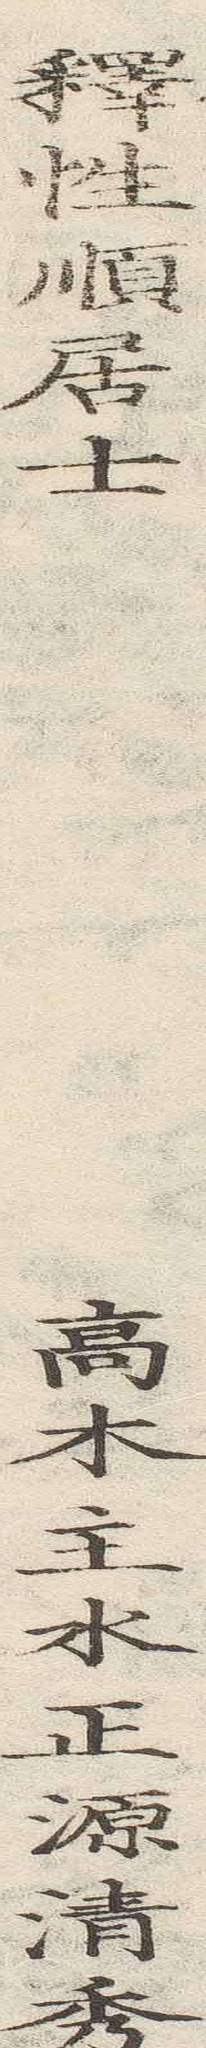釋性順居士高木主水正源清秀
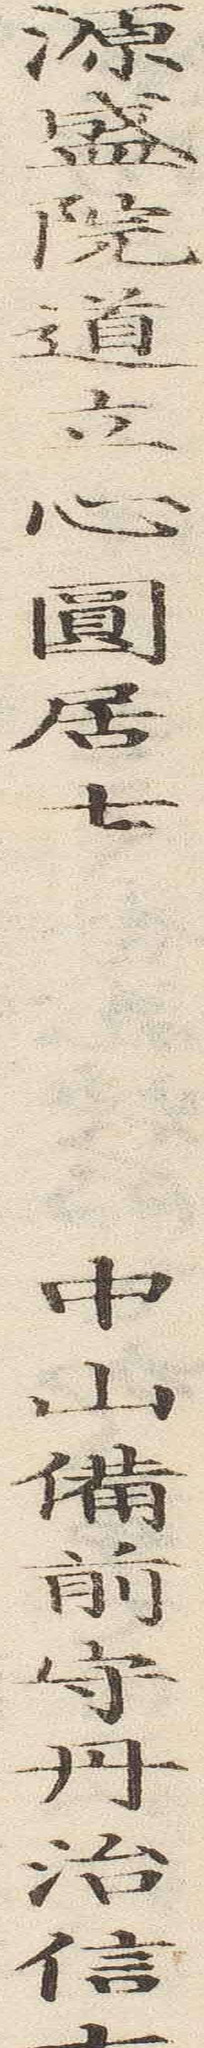源盛院道立心圓居士中山備前守丹治信吉
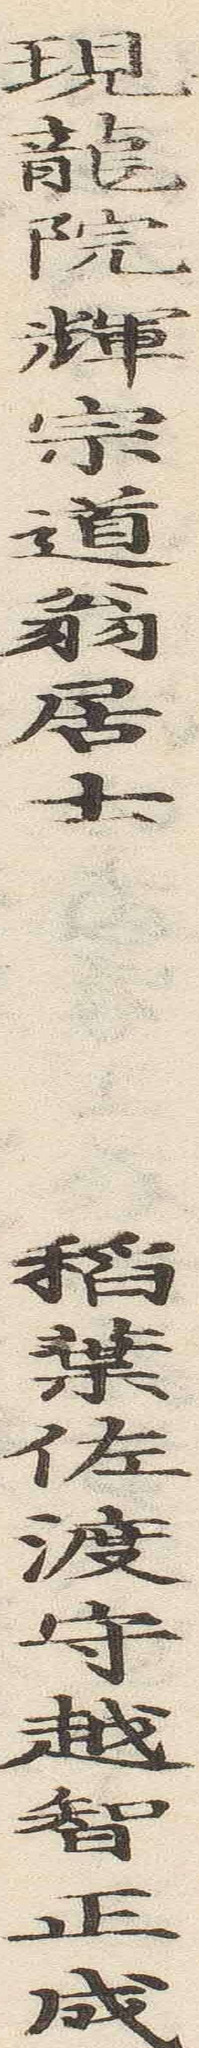現龍院輝宗道翁居士稻葉佐渡守越智正成
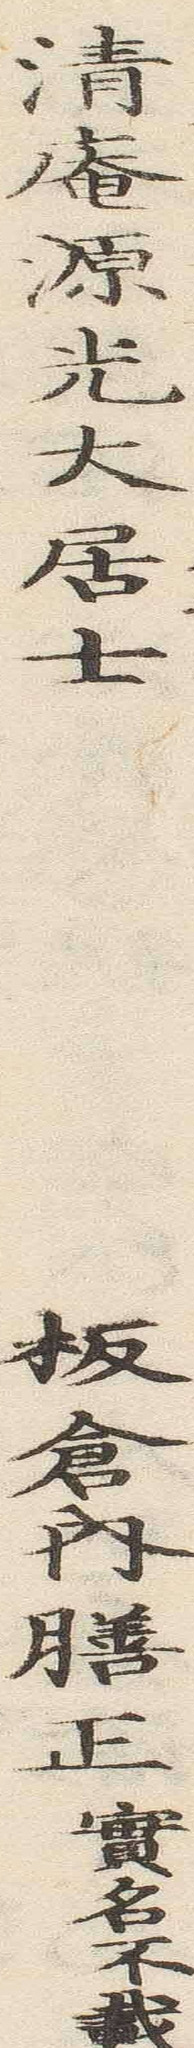清庵源光大居士板倉内膳正實名不載
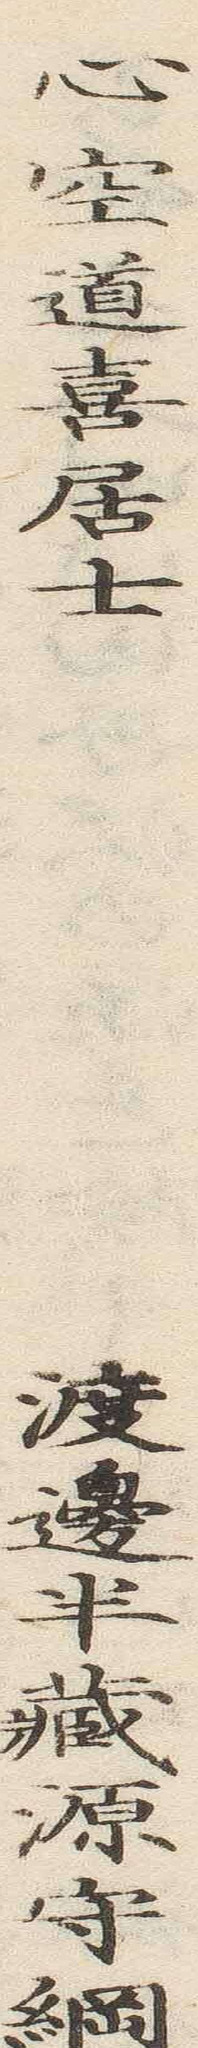心空道喜居士渡邊半藏源守綱
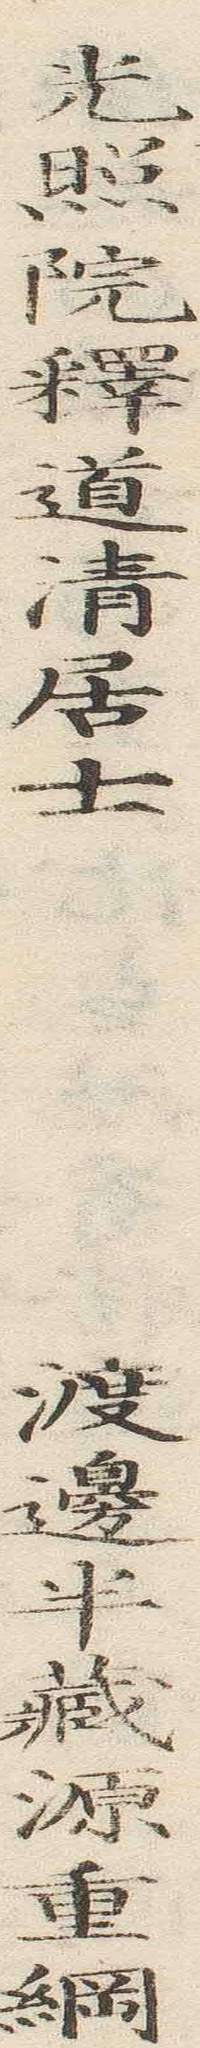光照院釋道清居士渡邊半藏源重綱
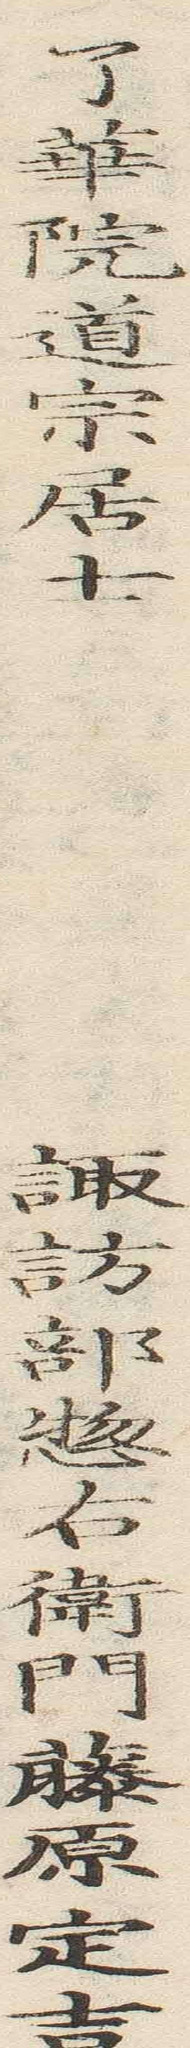了華院道宗居士諏訪部惣右衛門藤原定吉
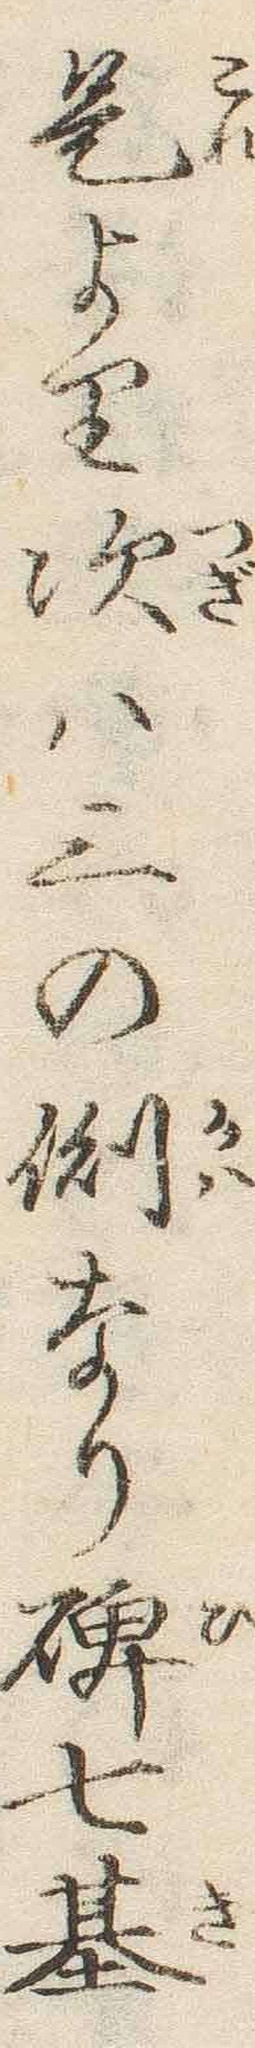是より次は三に側なり碑七基
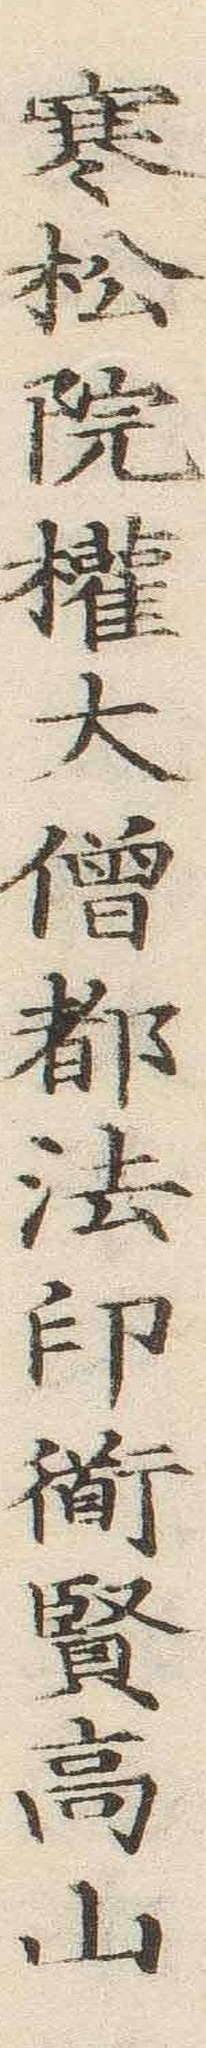寒松院權大僧都法印衜賢高山
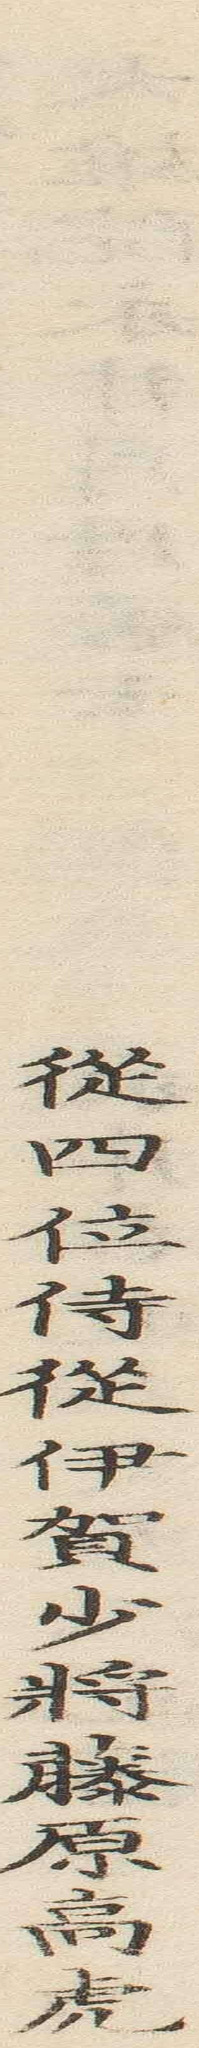從四位侍從伊賀少將藤原高虎
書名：日光山志
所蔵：東京学芸大学附属図書館 国文学研究資料館
